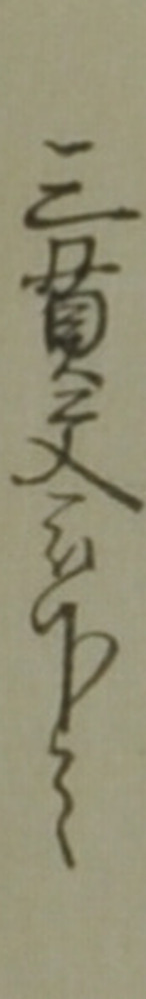三貫文被下之
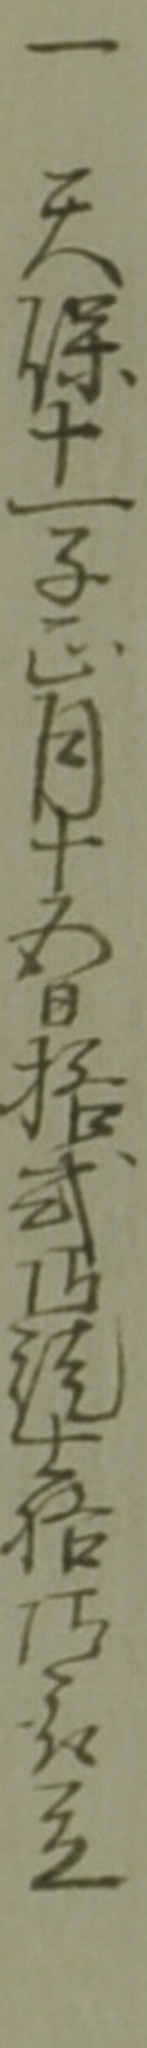一天保十一子正月十五日格式御徒士格御取立
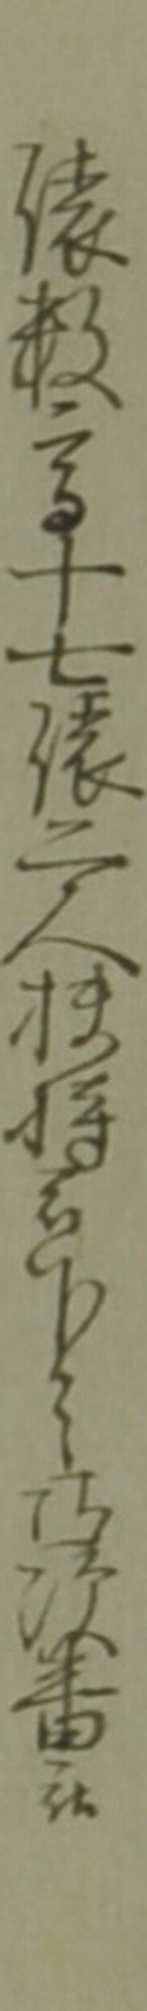俵数高十七俵二人扶持被下之御次番被
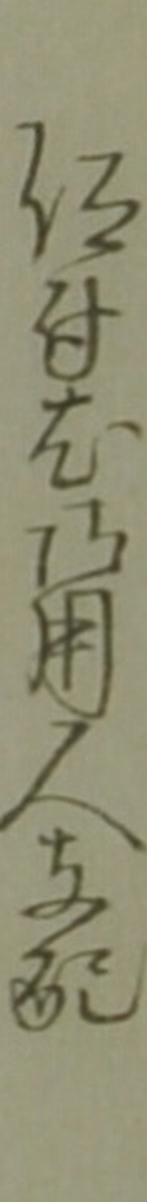仰付尤御用人支配
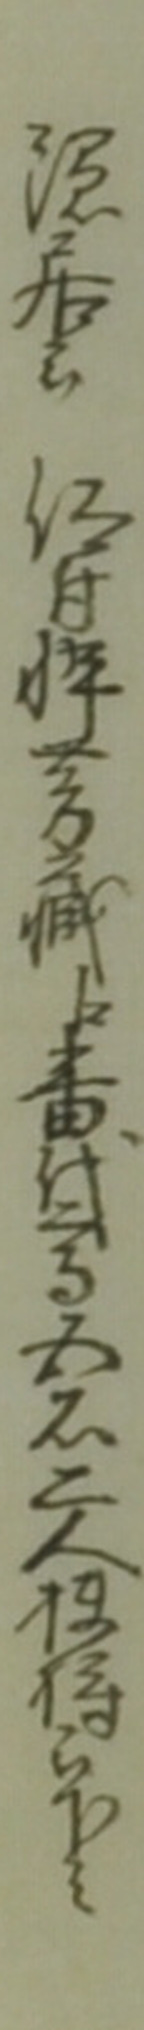隠居被仰付忰芳蔵江番代高五石二人扶持被下之
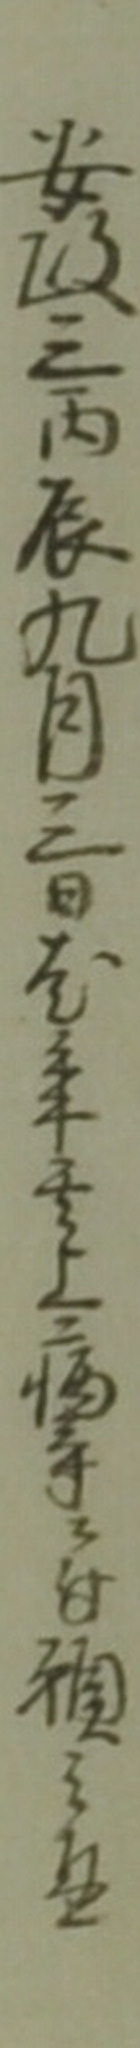一安政三丙辰九月三日老年其上病気ニ付願之通
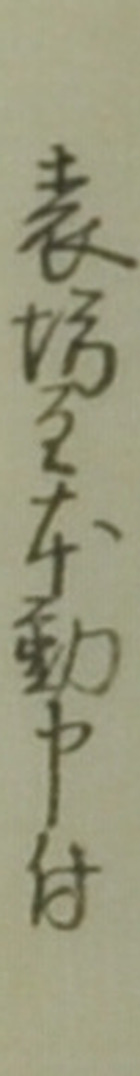表坊主本勤申付

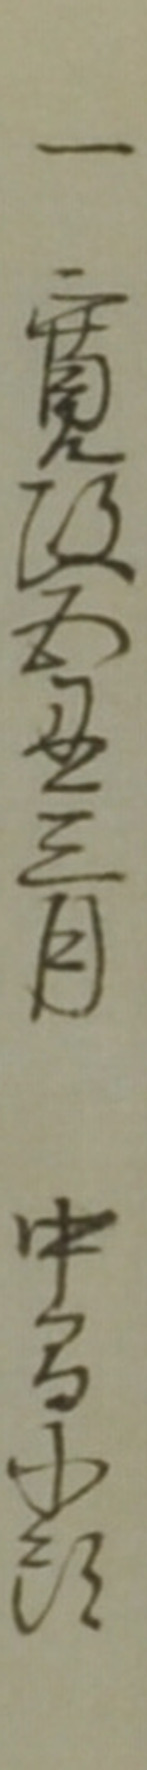一寛政五丑三月中間小頭
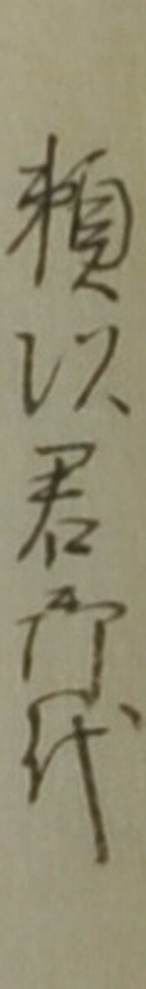頼以君御代
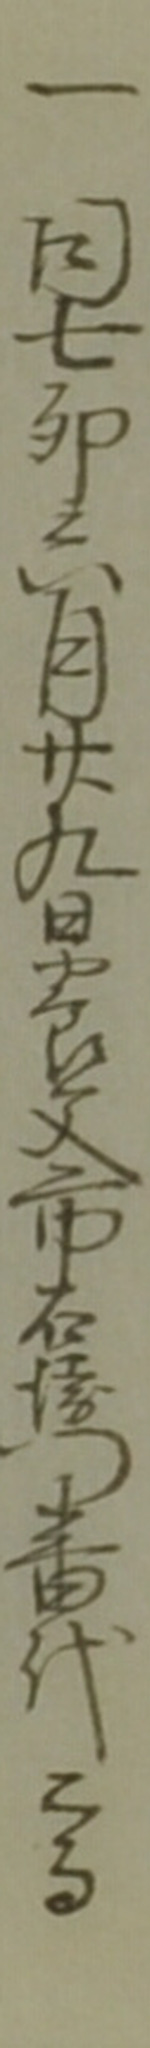一同七卯六月廿九日養父市右衛門番代高
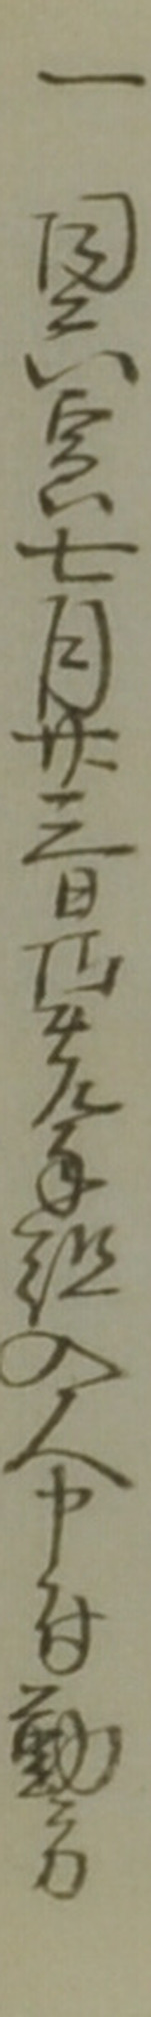一同六寅七月廿三日御先手組入人申付勤方
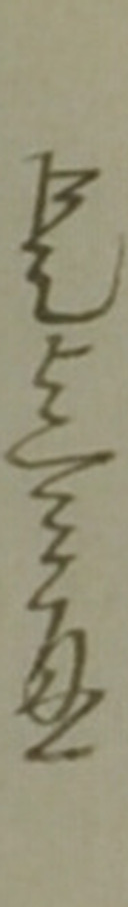是迄之通
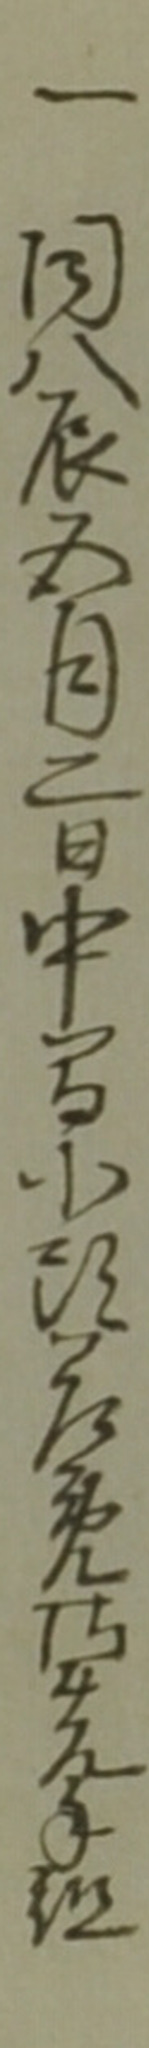一同八辰五月二日中間小頭差免御先手組
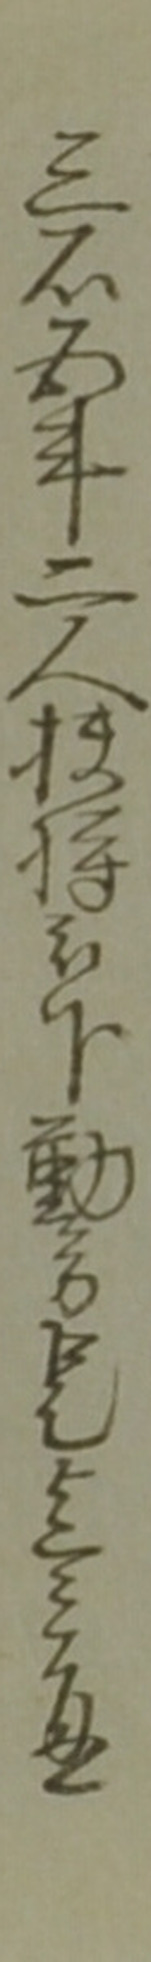三石五斗二人扶持被下勤方是迄之通
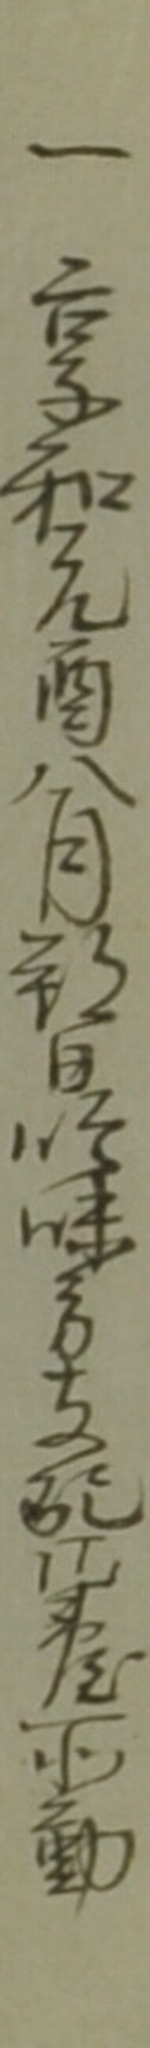一享和元酉八月朔日吟味方支配御台所勤
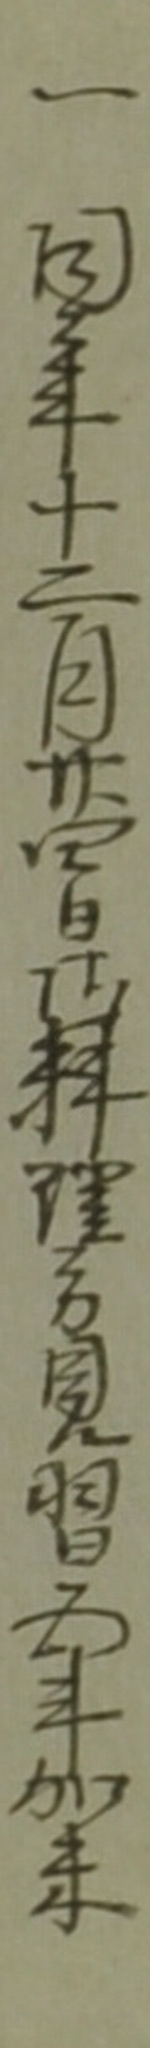一同年十二月廿四日御料理方見習五斗加米
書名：無足諸士勤仕録（八）
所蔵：伊那市立高遠町図書館・合同会社AMANE
